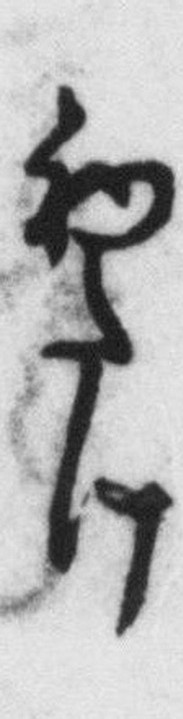初たけ
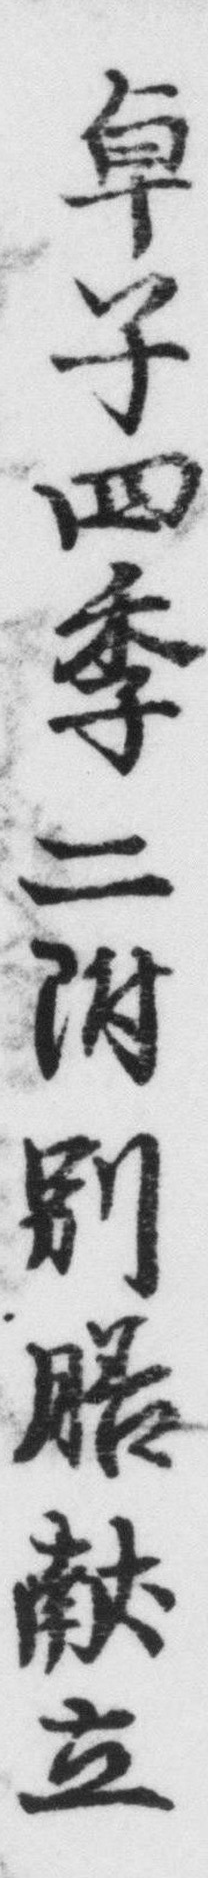卓子四季二附別膳献立
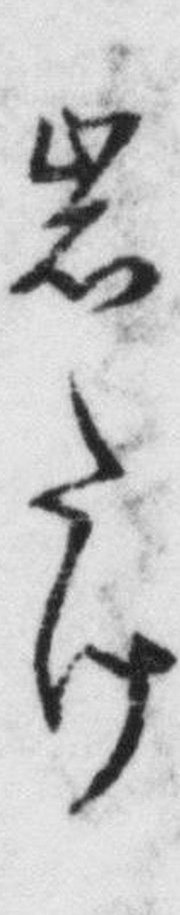初たけ
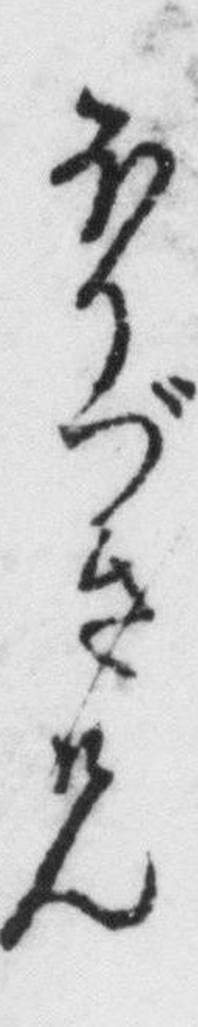ほうづきけん飯
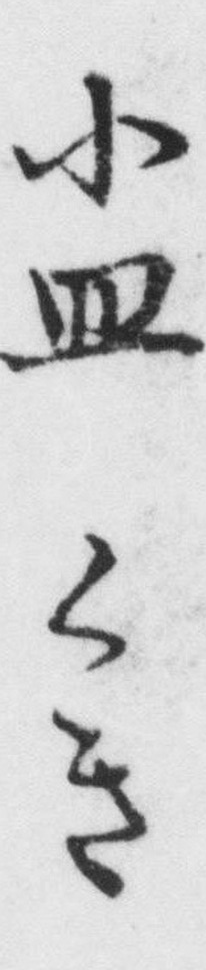小皿くき

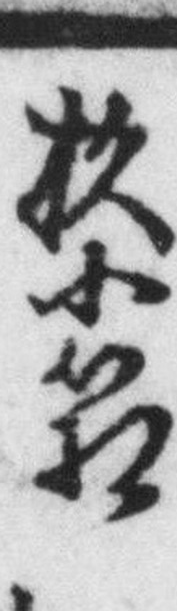杦小箱
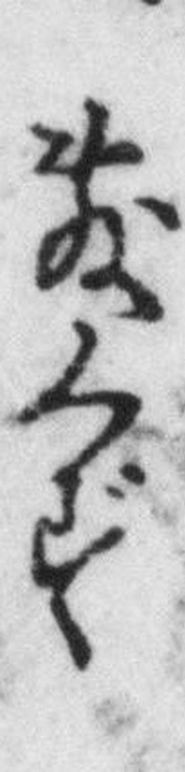薄くず
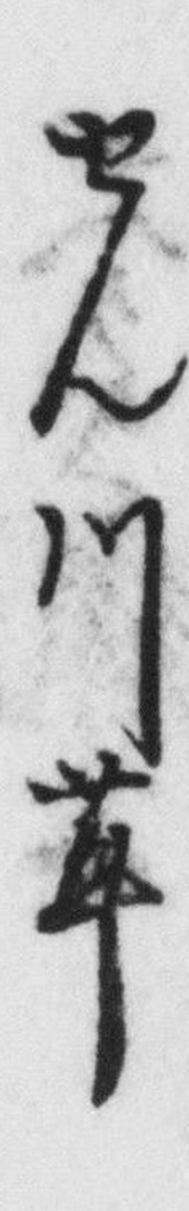せん川茸
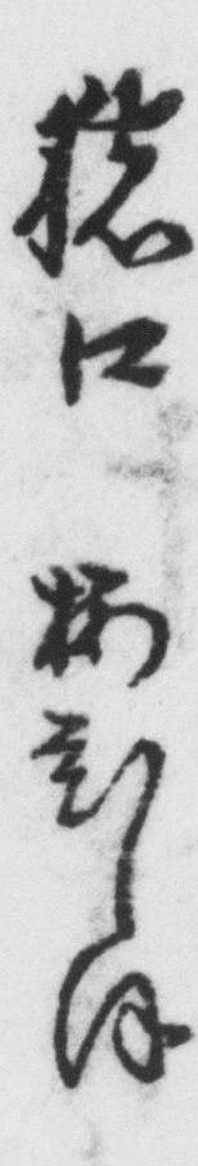猪口梅ひしほ
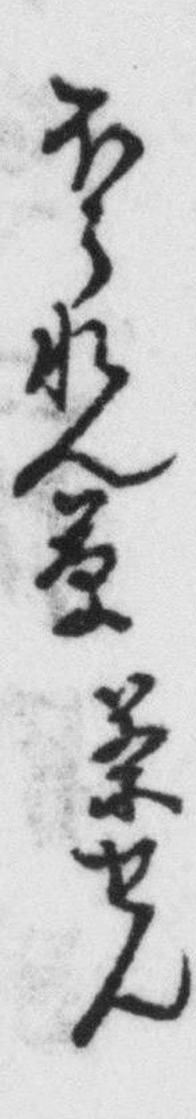ほうれん草茶せん
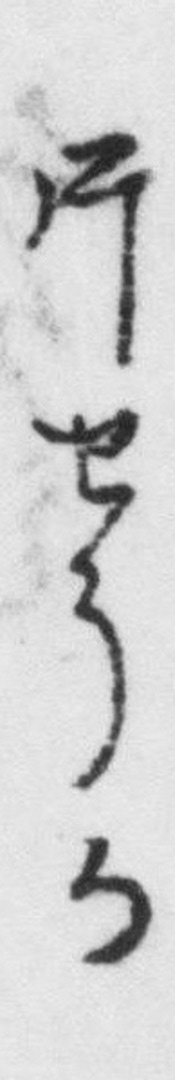片せうか
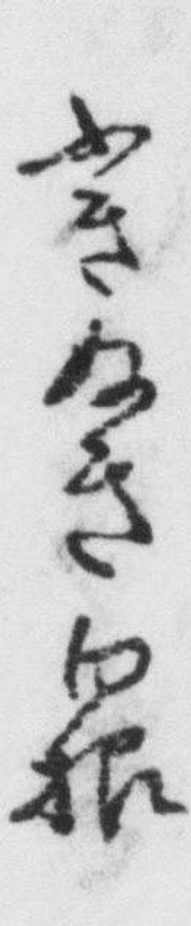ふきぬき白根

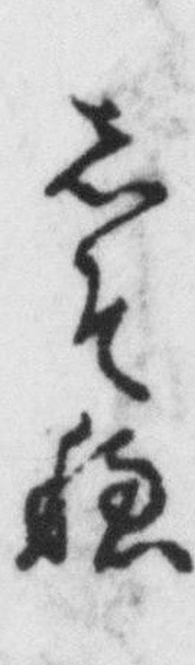しそ穂
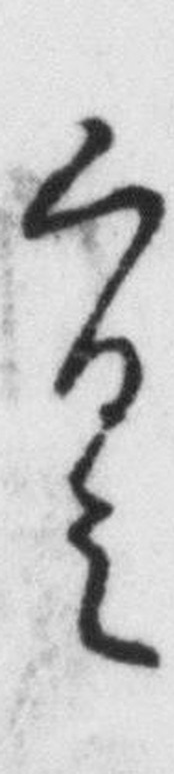くるみ
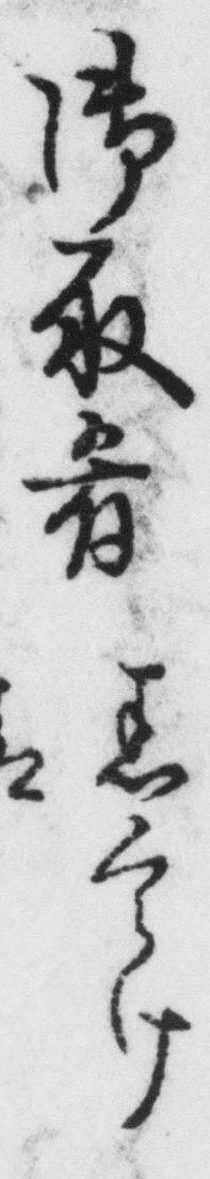御取肴黒くらけ
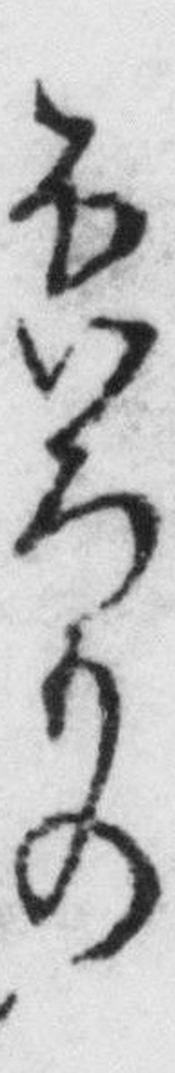ほいろもの
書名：卓子料理仕様
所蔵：大阪府立大学学術情報センター 国文学研究資料館
